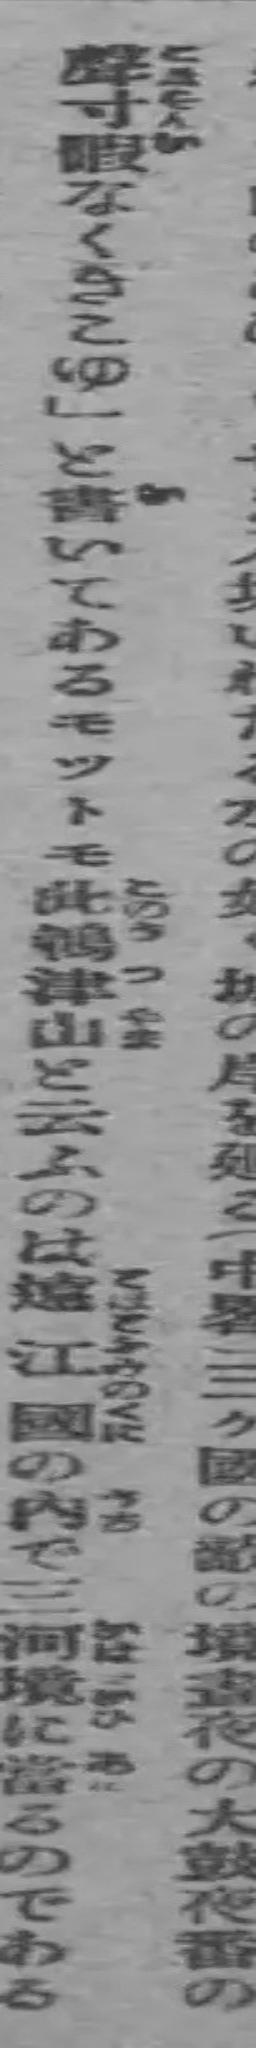声寸暇なくきこゆ」と書いてあるモツトモ此鵜津山と云ふのは遠江国の内で三河境に当るのである
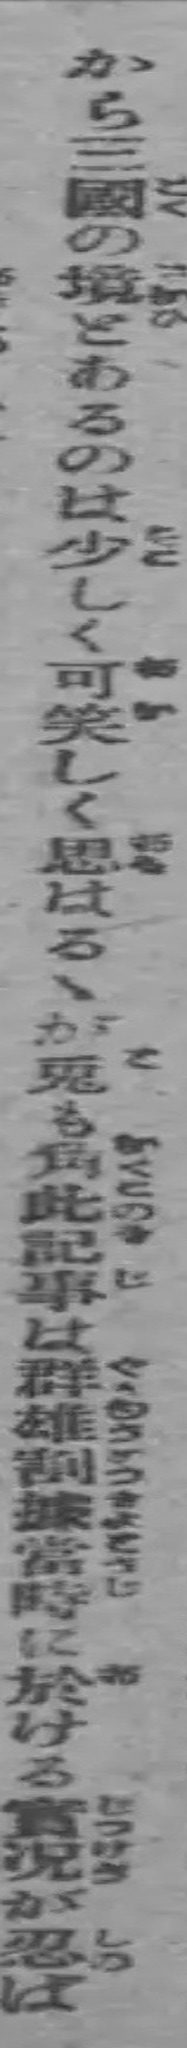から三国の境とあるのは少しく可笑しく思はるゝが兎も角此記事は群雄割拠当時に於ける実況が忍ば
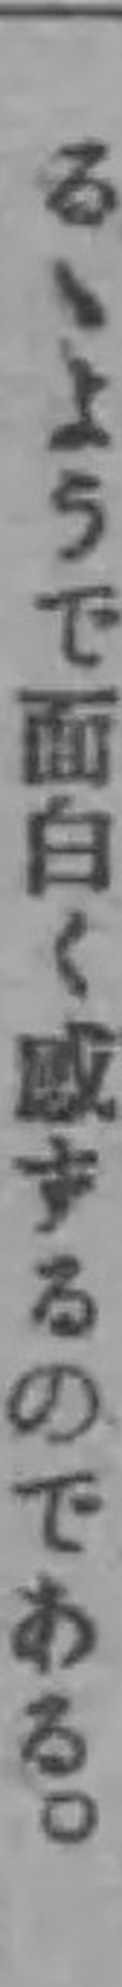るゝようで面白く感ずるのである。
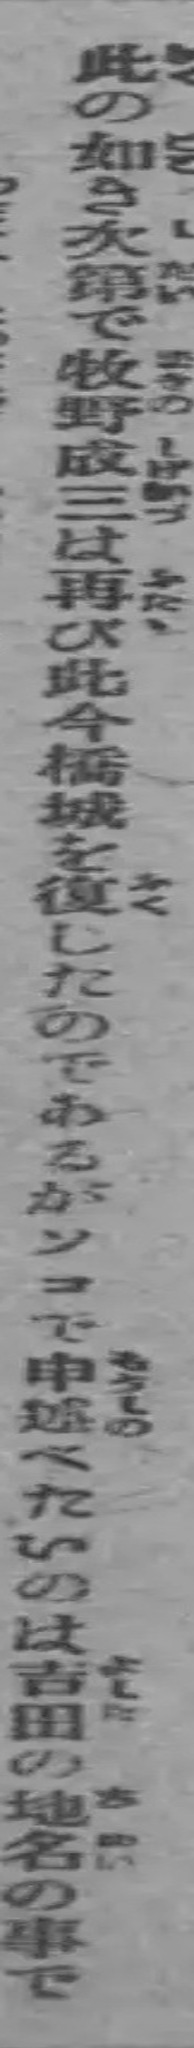吉田の地名此の如き次第で牧野成三は再び此今橋城を復したのであるがソコで申述べたいのは吉田の地名の事で
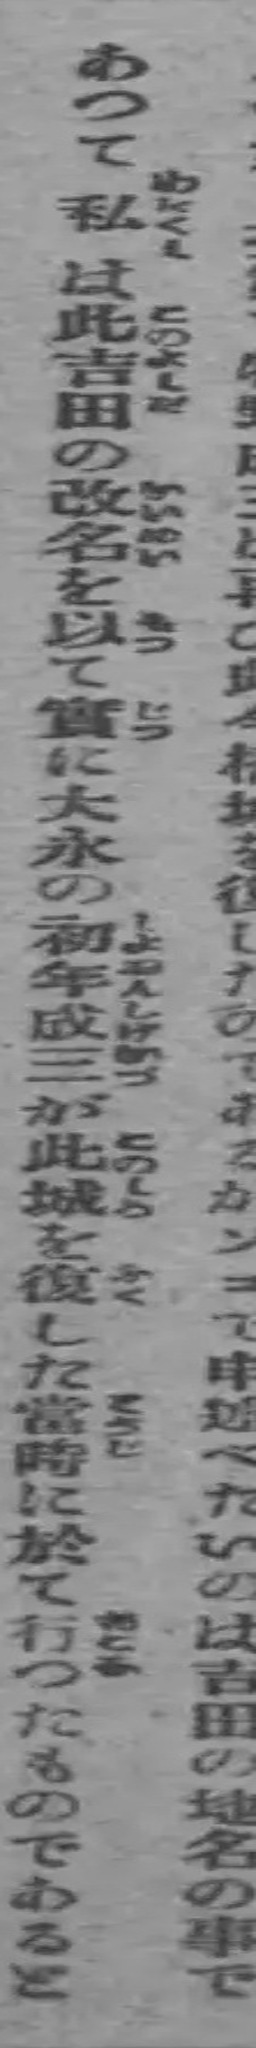あつて私は此吉田の改名を以て実に大永の初年成三が此城を復した当時に於て行つたものであると
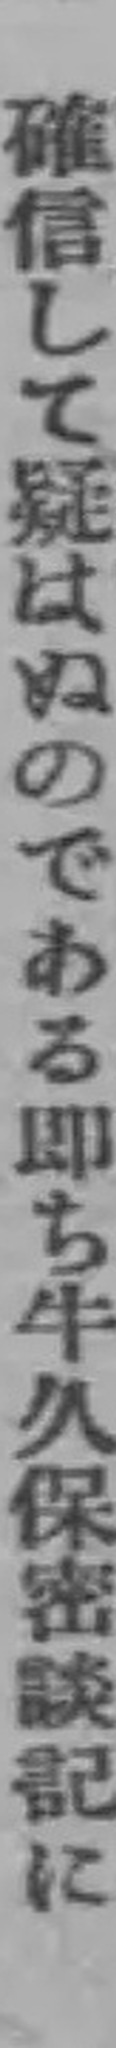確信して疑はぬのである即ち牛久保密談記に
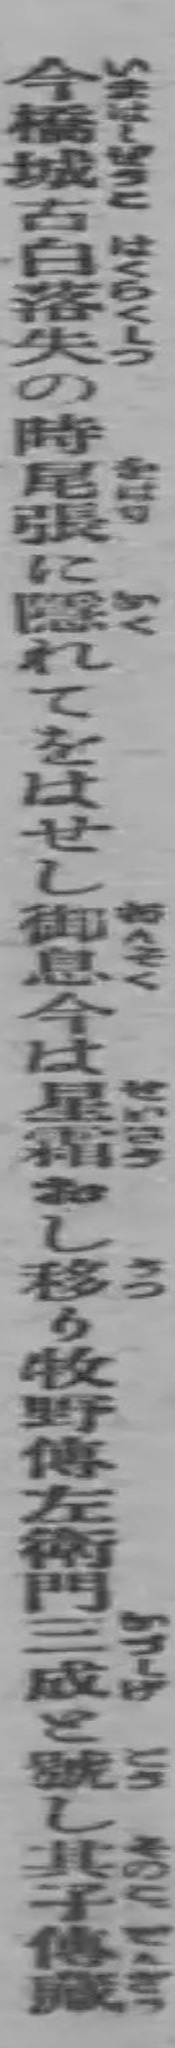今橋城古白落失の時尾張に隠れてをはせし御息今は星霜おし移り牧野傳左衛門三成と号し其子傳蔵
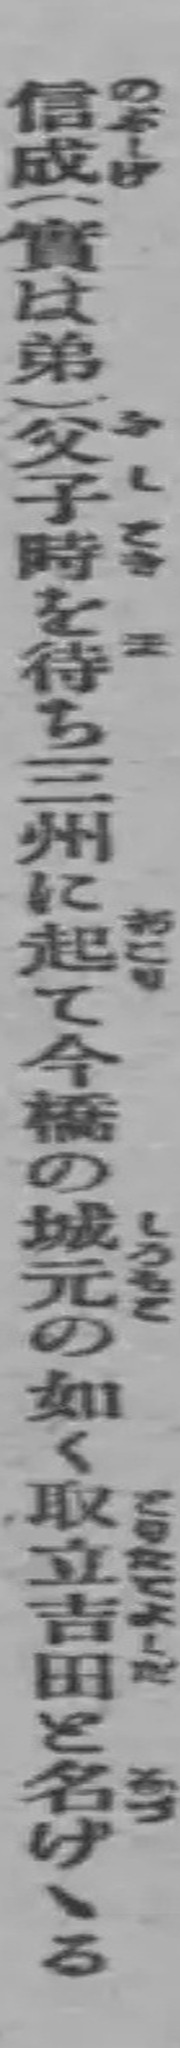信成(実は弟)父子時を待ち三州に起て今橋の城元の如く取立吉田と名けゝる
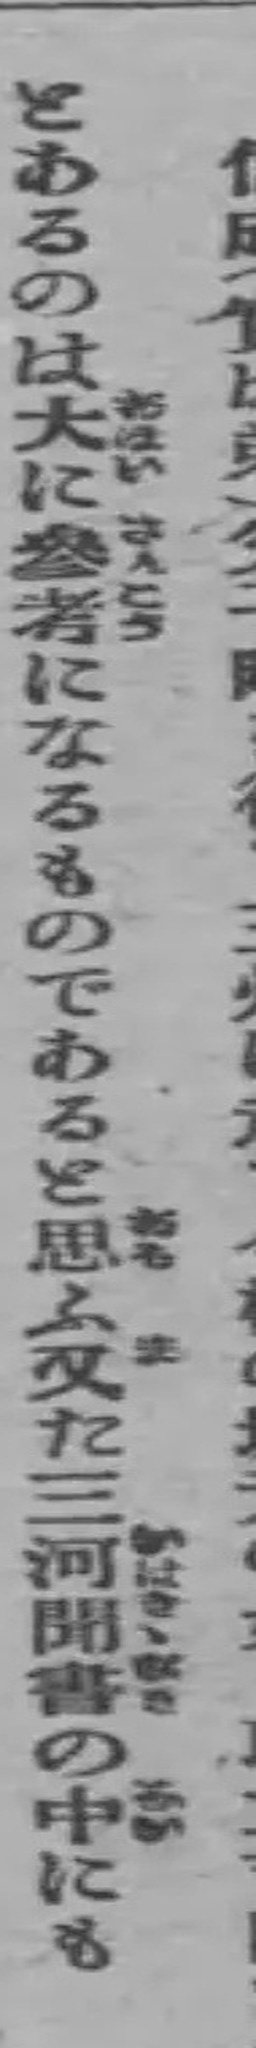とあるのは大に参考になるものであると思ふ又た三河聞書の中にも
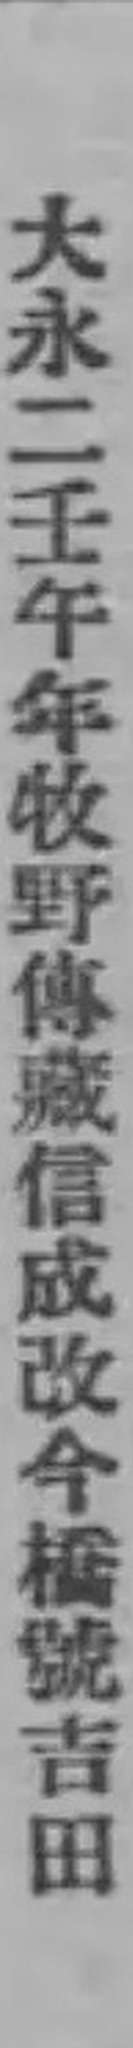大永二壬午牧野傳蔵信成改今橋号吉田
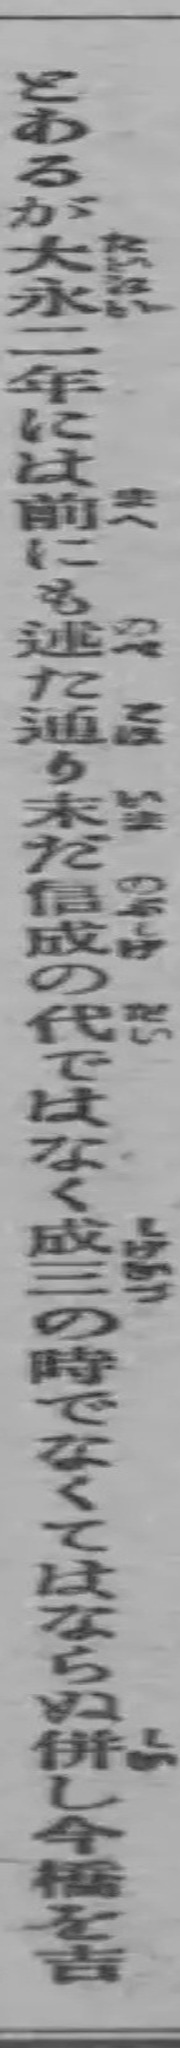とあるが大永二年には前にも述べた通り未だ信成の代ではなく成三の時でなくてはならぬ併し今橋を吉
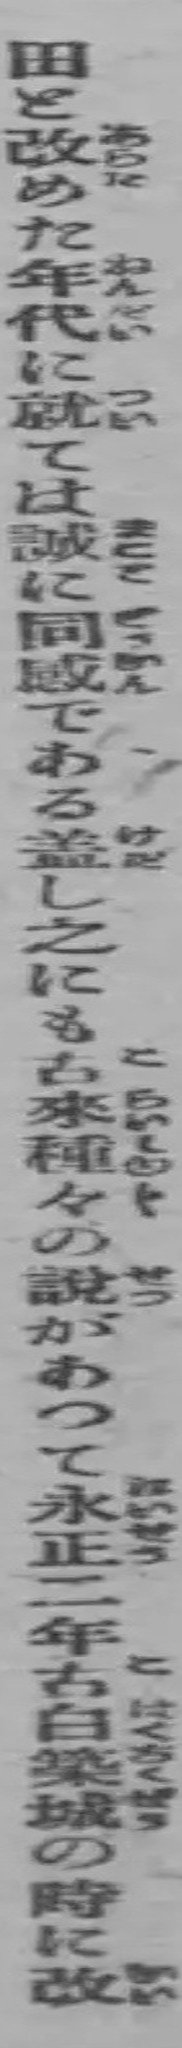田と改めた年代に就ては誠に同感である蓋し之にも古来種々の説があつて永正二年古白築城の時に改
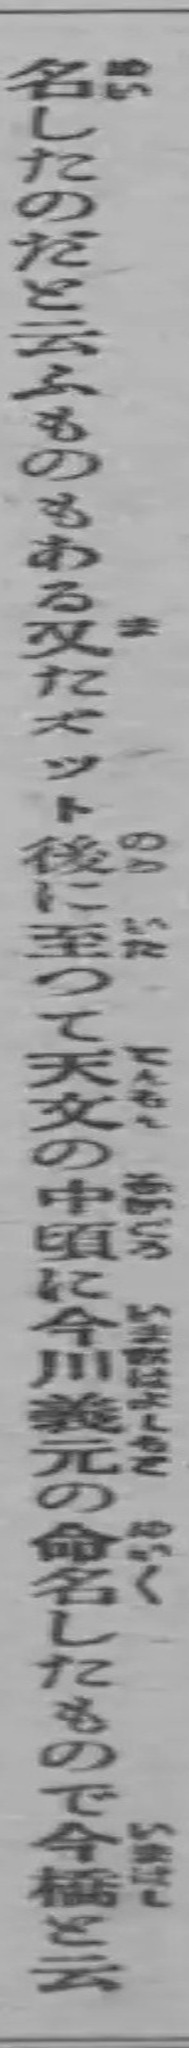名したのだと云ふものもある又たズツト後に至つて天文の中頃に今川義元の命名したもので今橋と云
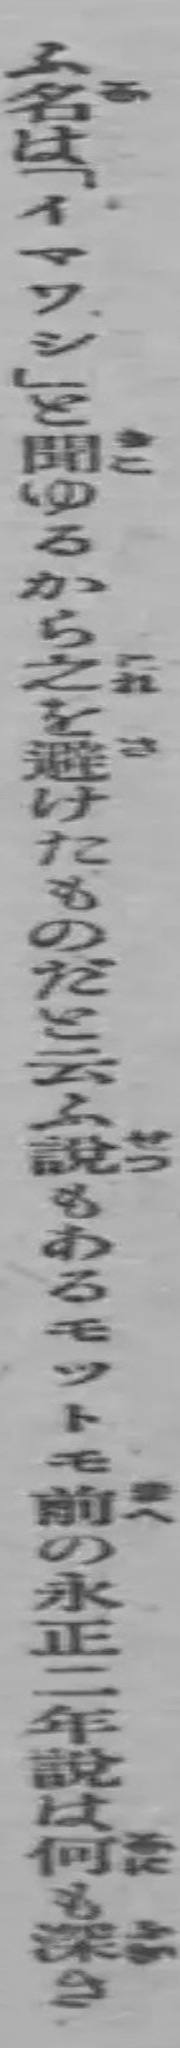ふ名は「イマワシ」と聞ゆるから之を避けたものだと云ふ説もあるモツトモ前の永正二年説は何も深き
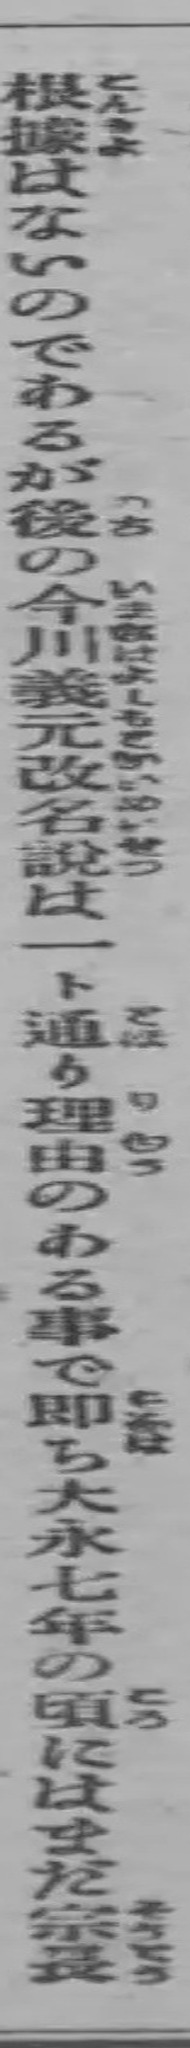根拠はないのであるが後の今川義元改名説は一ト通り理由のある事で即ち大永七年の頃にはまだ宗長
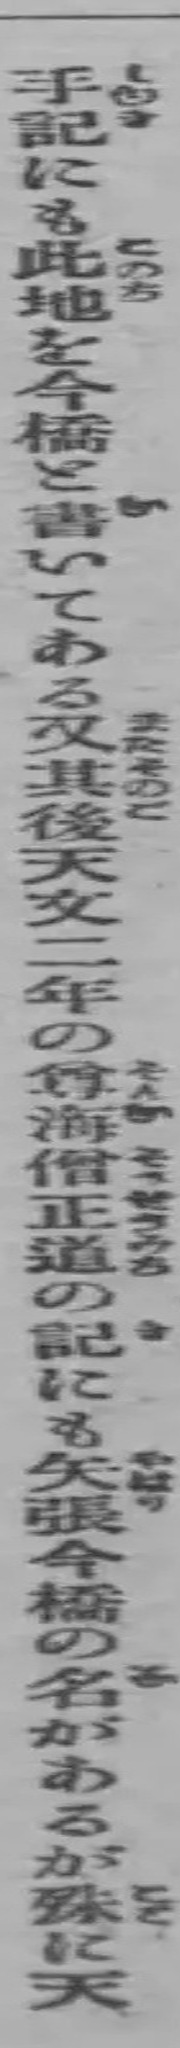手記にも此地を今橋と書いてある又其後天文二年の尊海僧正道の記にも矢張今橋の名があるが殊に天
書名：豊橋市史談
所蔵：国立国会図書館 National Diet Library, JAPAN
